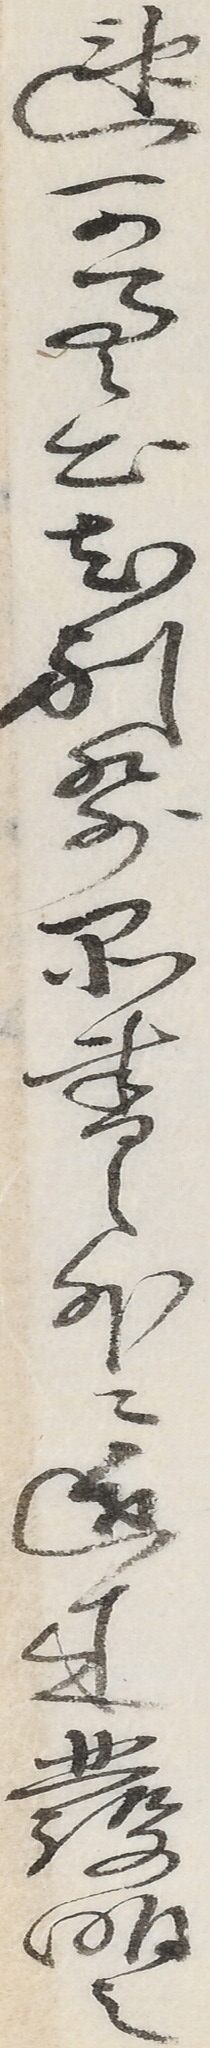速可事候出尤別紙品書之外ニ近来発明之
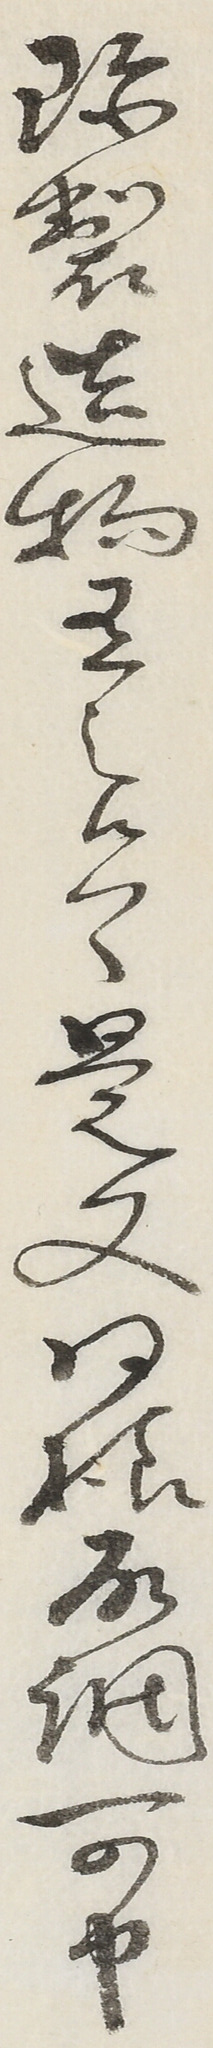弥製造物有之候ハヽ是又同様取調可申
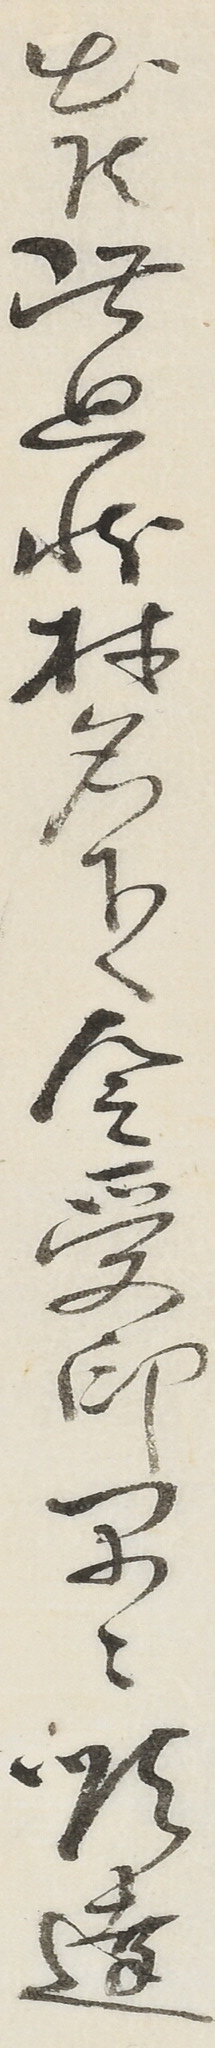出候此廻状村名下へ金受印早々順達
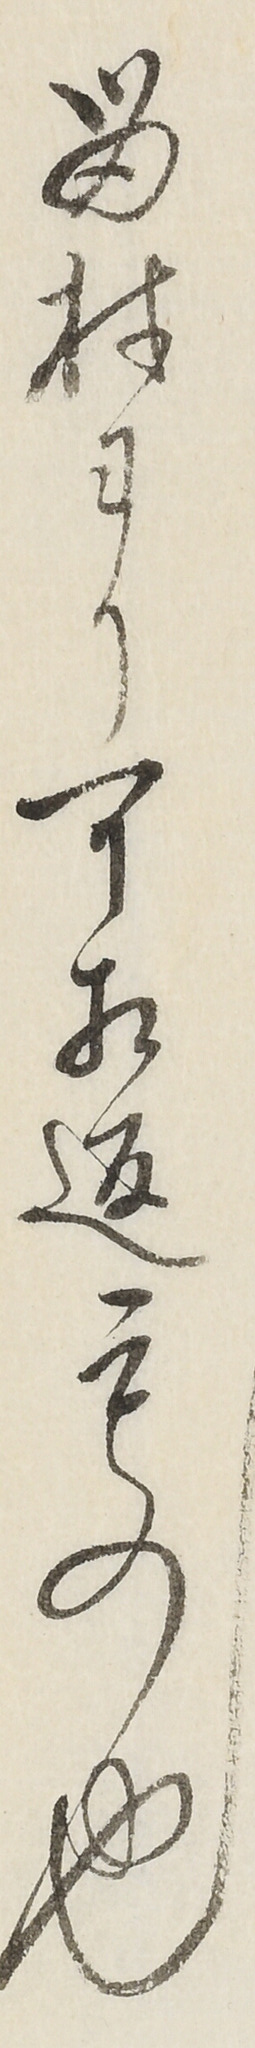留村ヨリ可相返もの也
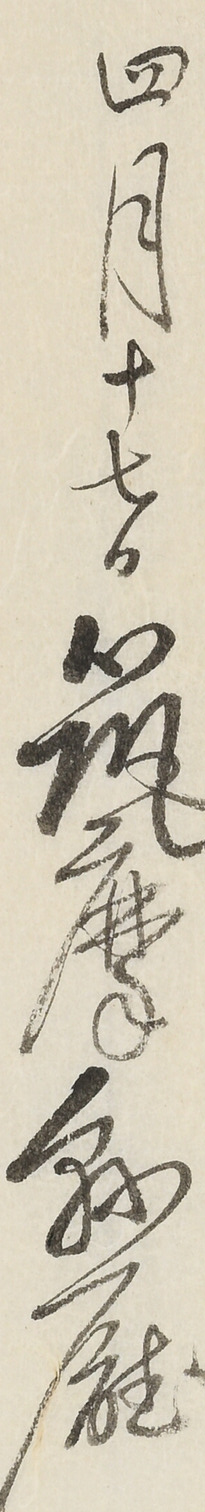四月十七日筑摩県庁

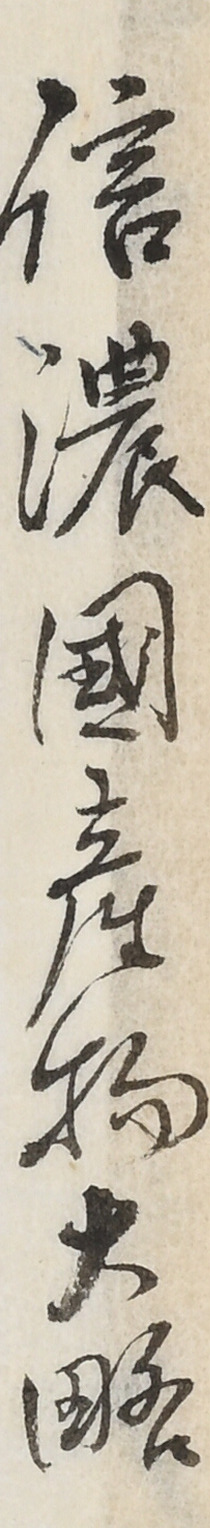信濃国産物大略
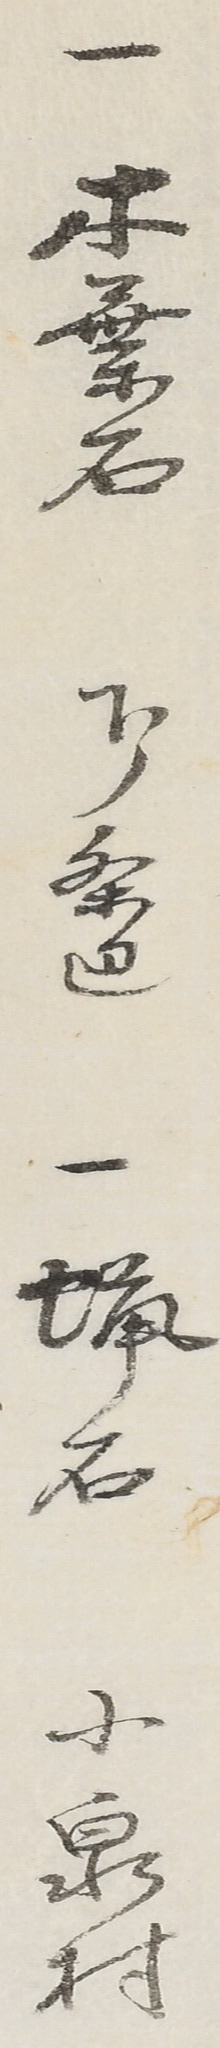一木葉石下ノ条辺一蝋石小泉村
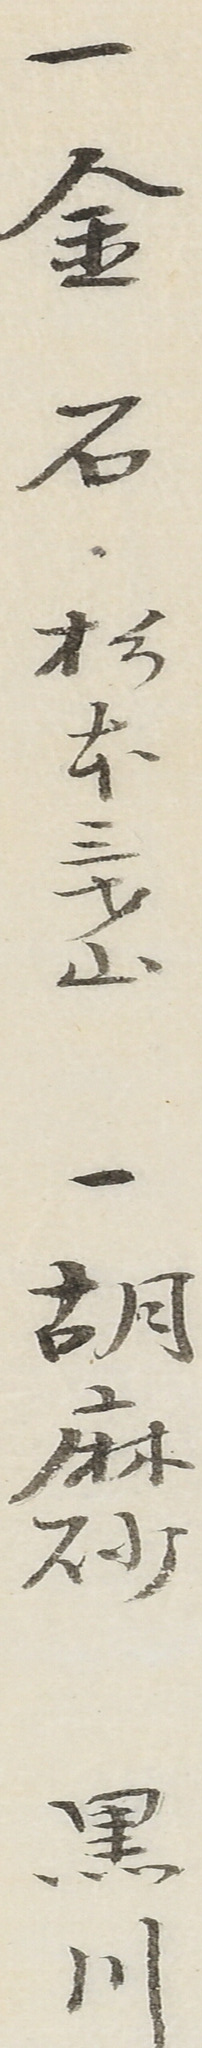一金石杉本三才山一胡麻砂黒川
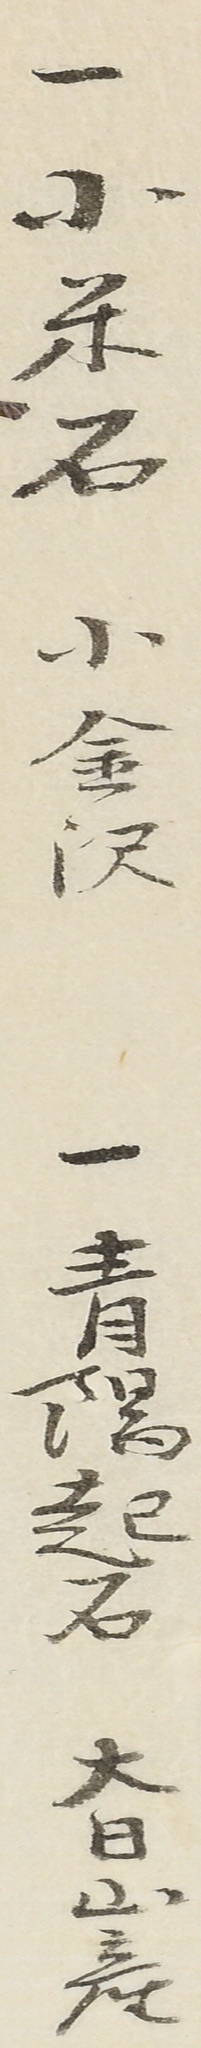一小米石小金沢一青陽起石大日山産

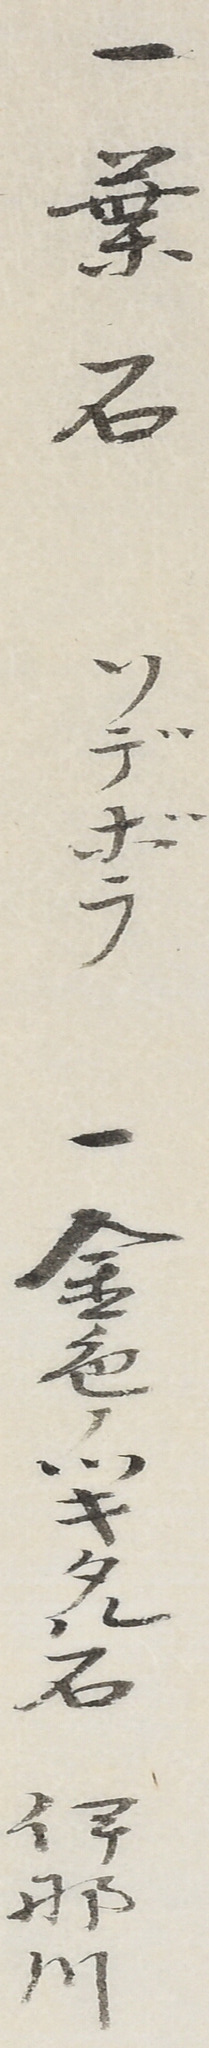一葉石ソデボラ一金色ノツキタル石伊那川
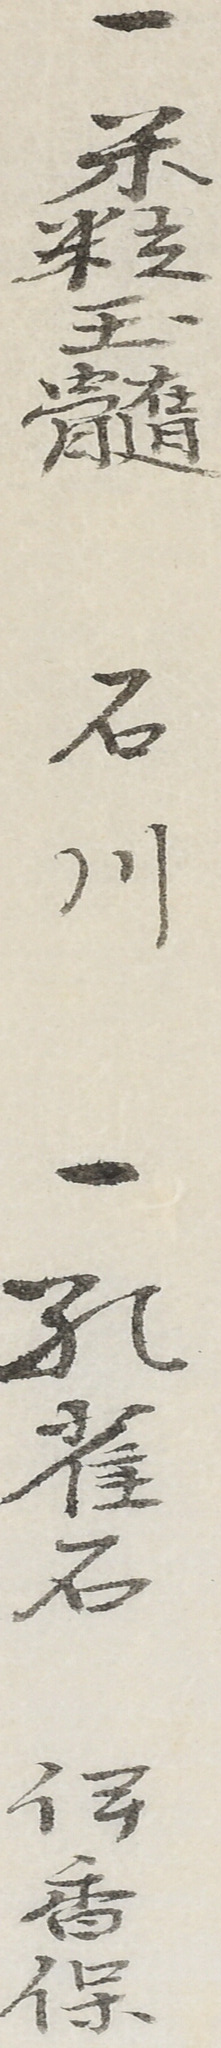一米粒玉髄石川一孔雀石伊香保
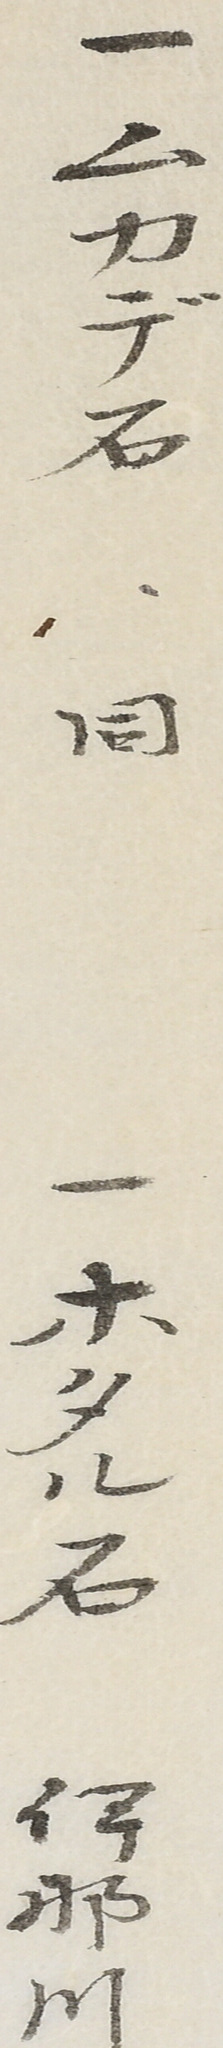一ムカデ石同一ホタル石伊那川
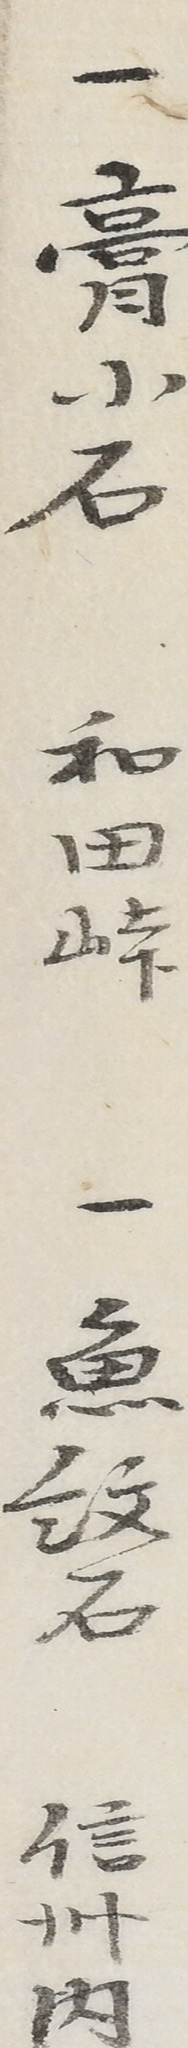一膏小石和田峠一魚紋石信州内
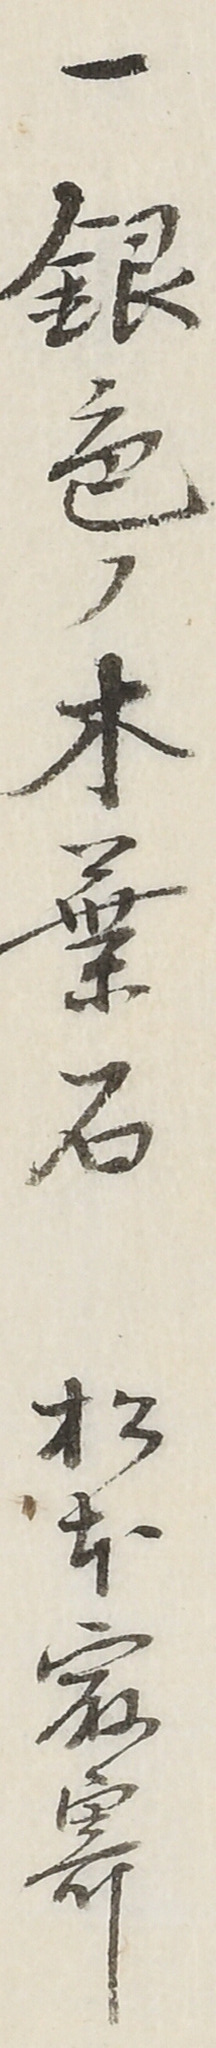一銀色ノ木葉石松本最寄
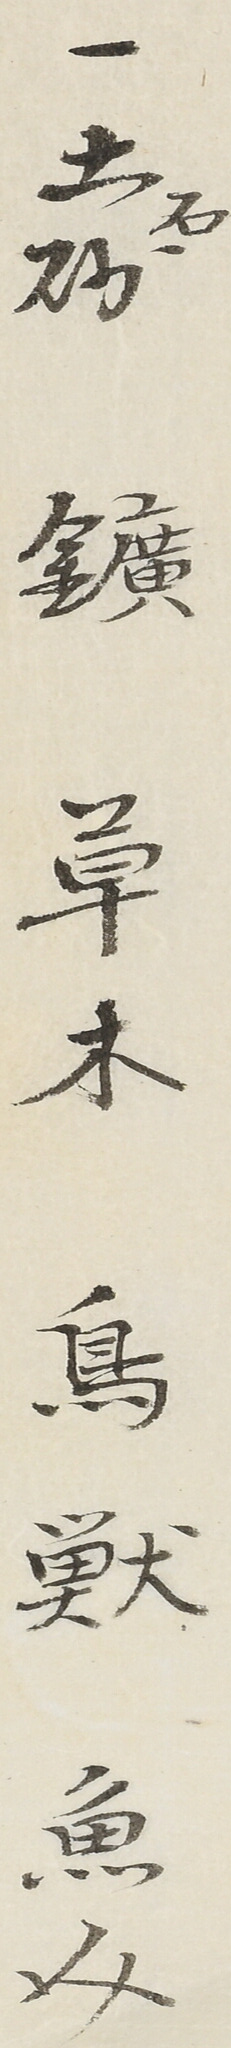一土石砂鉱草木鳥獣魚介
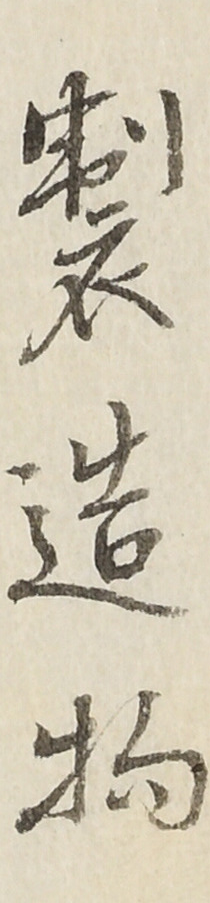製造物
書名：廻状（控）
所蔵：伊那市立高遠町図書館・合同会社AMANE
